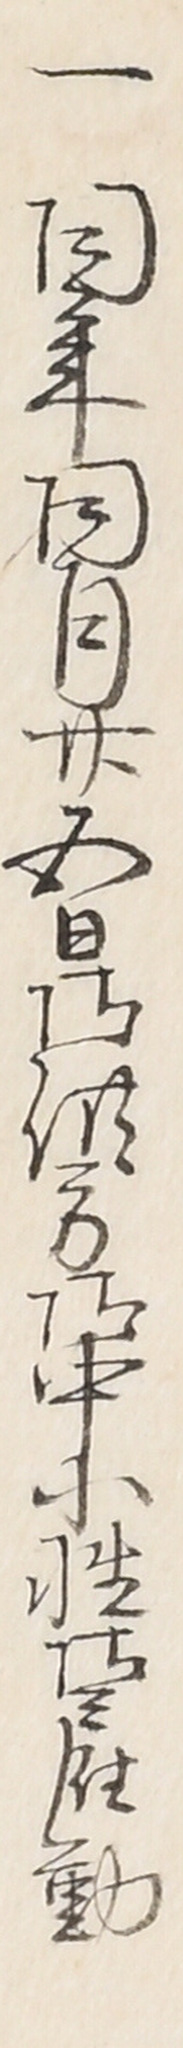一同年同月廿五日御供方御中小姓御雇勤
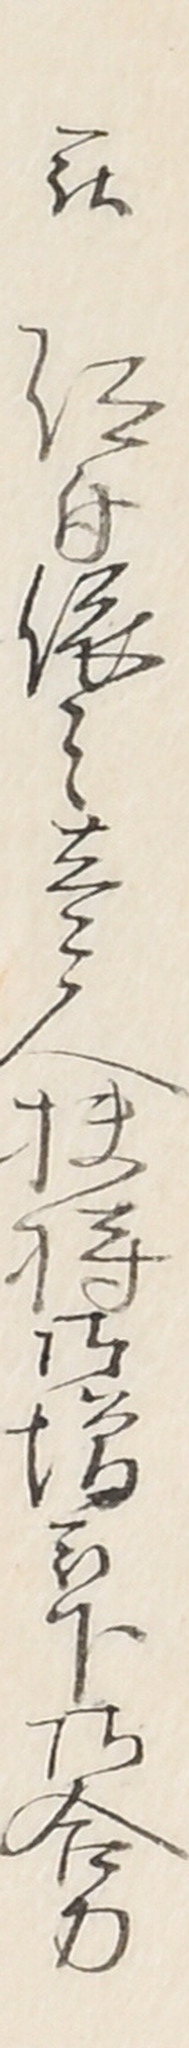被仰付依之壱人扶持御増召下御合力
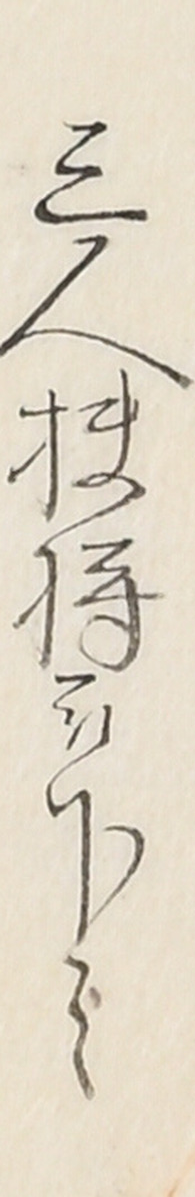三人扶持被下之
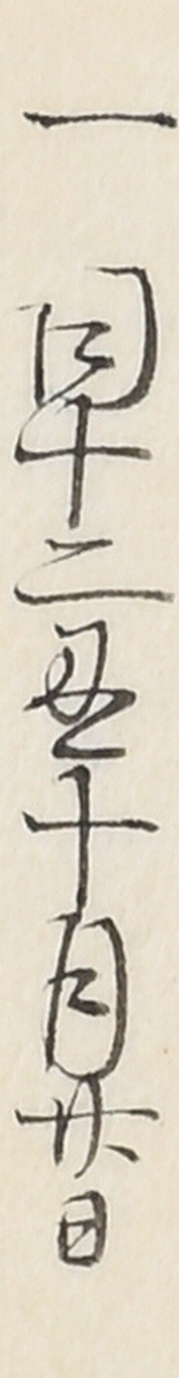一同十二丑十月廿日
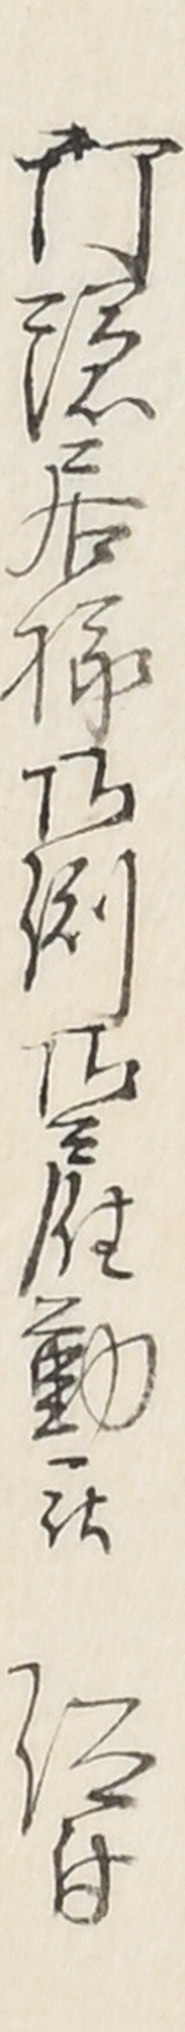御隠居様御側御雇勤被仰付
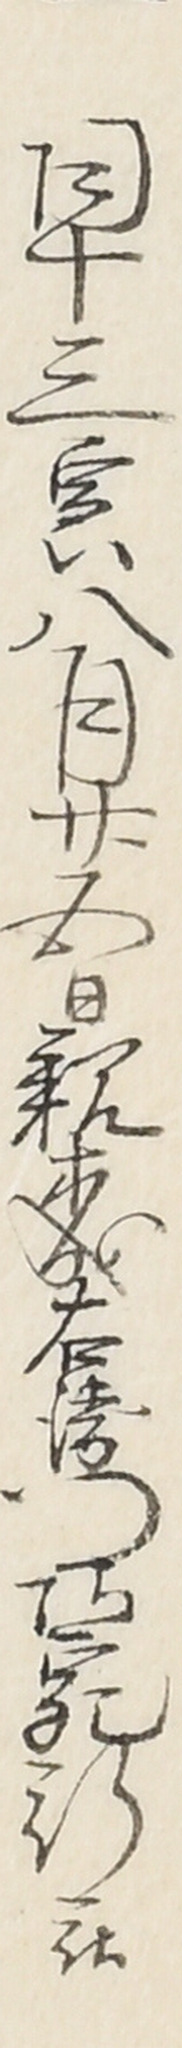一同十三寅八月廿五日親森右衛門御宛行被
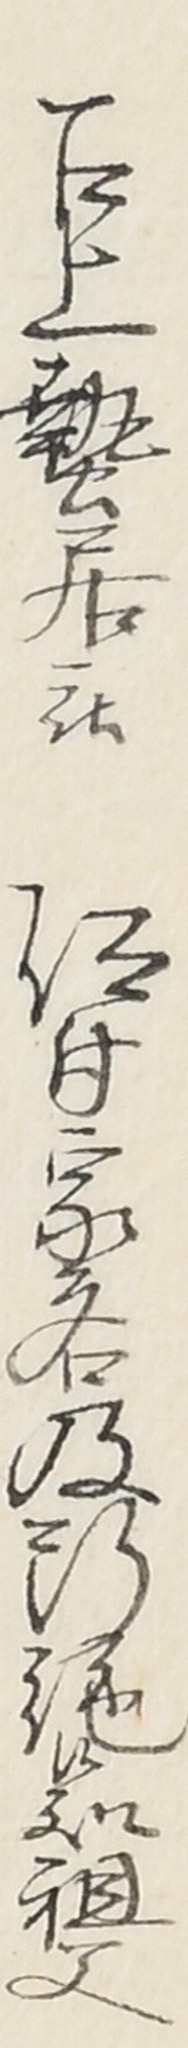召上蟄居被仰付家名及断絶候処祖父
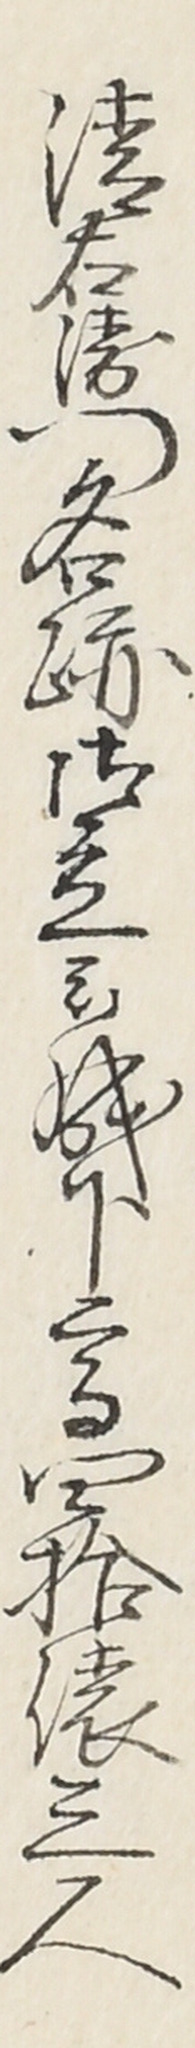清右衛門名跡御立被成下高四拾俵三人
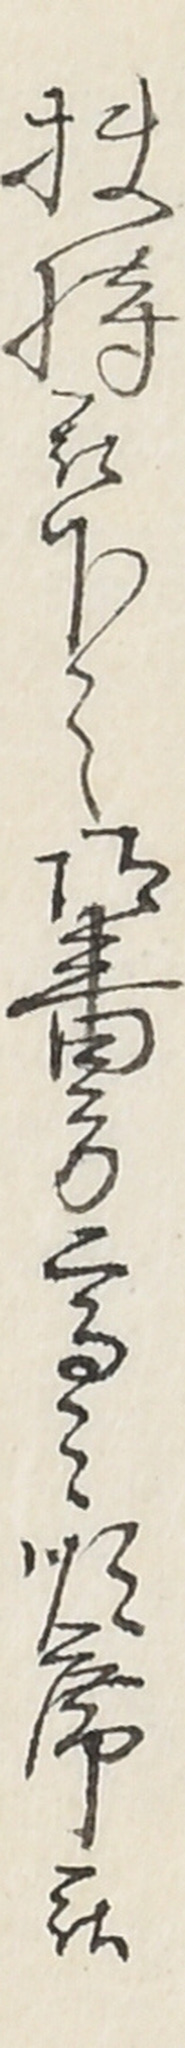扶持被下之御番方高之順席被
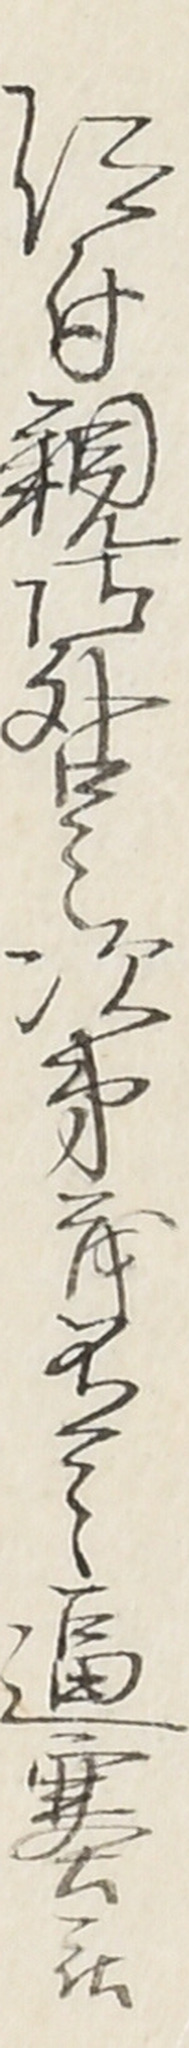仰付親御外足次第も有之逼塞被
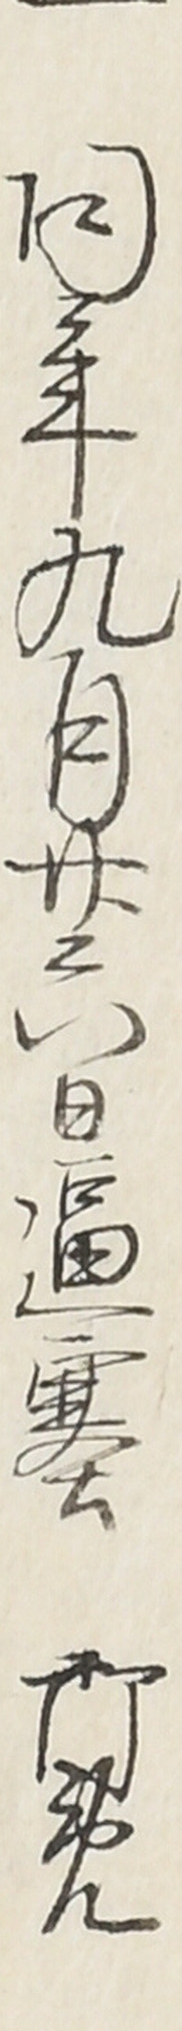一同年九月廿六日逼塞御免
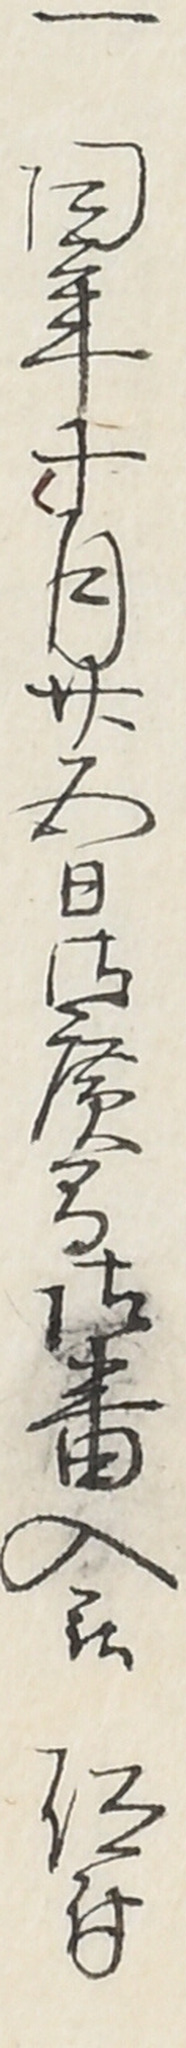一同年十月廿五日御広間御番入被仰付
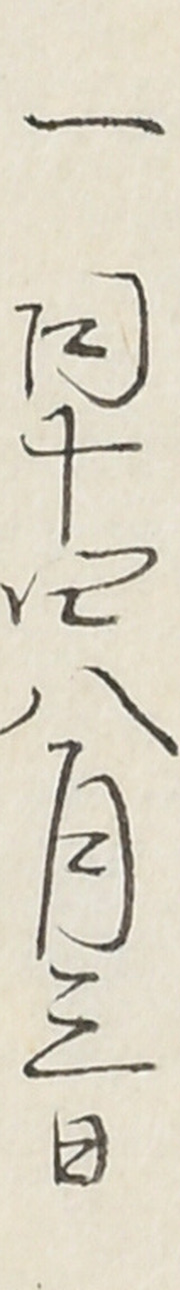一同十四八月三日
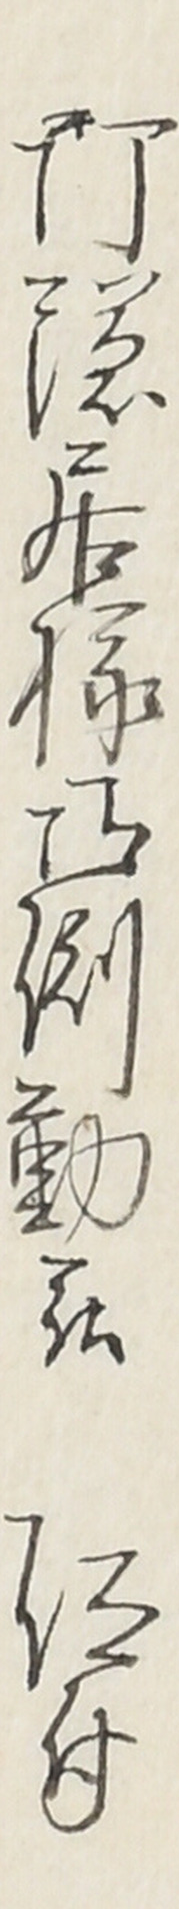御隠居様御側勤被仰付
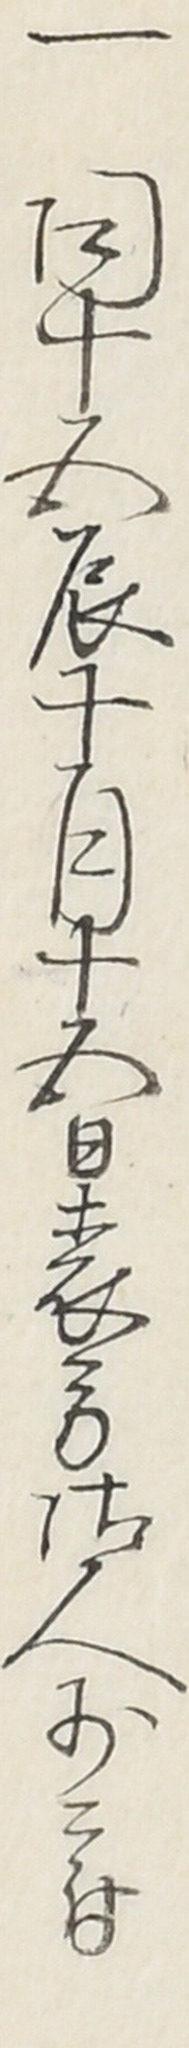一同十五辰十月十五日表方御人少ニ付
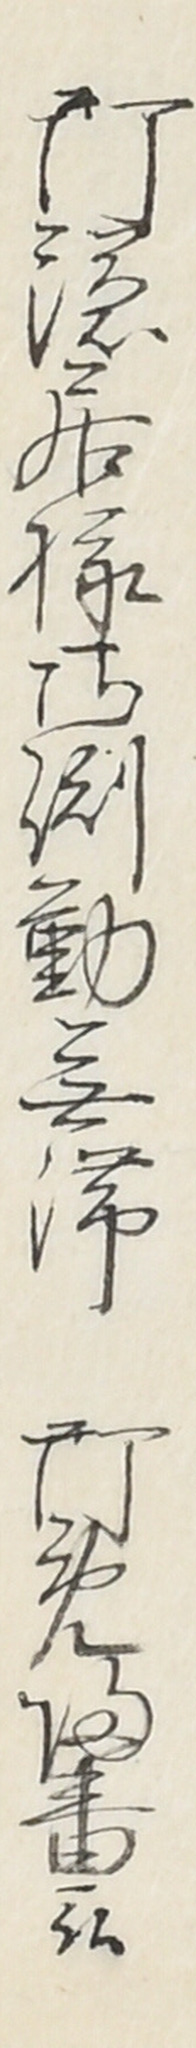御隠居様御側勤無滞御免帰番被
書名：給人諸士勤仕録（七）
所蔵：伊那市立高遠町図書館・合同会社AMANE
